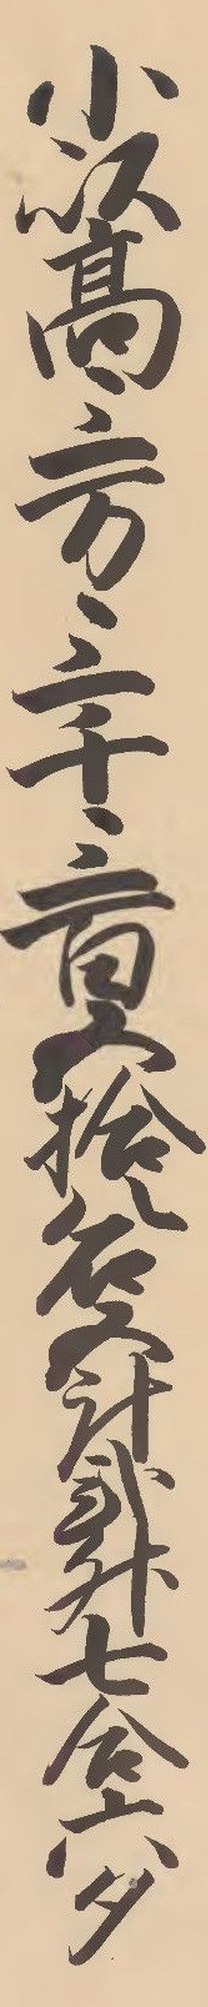小以高三万三千三百五拾八石五斗弐升七合六勺

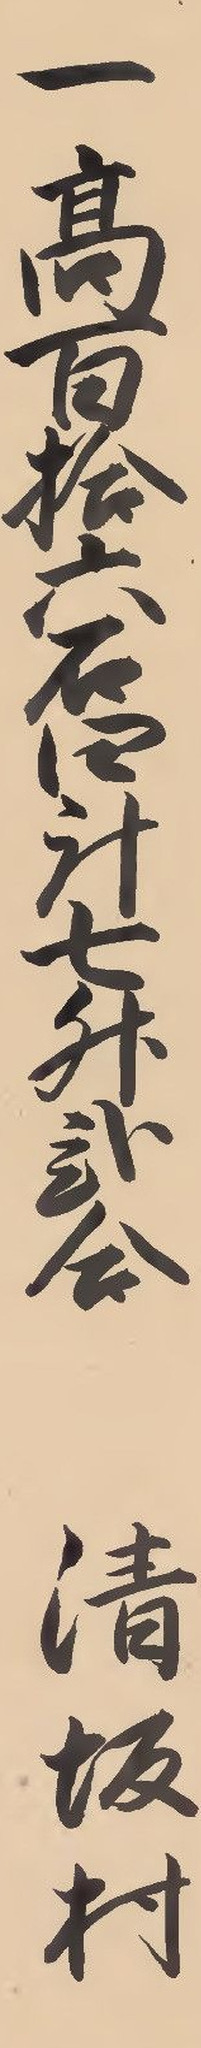一高百拾六石四斗七升弐合清坂村
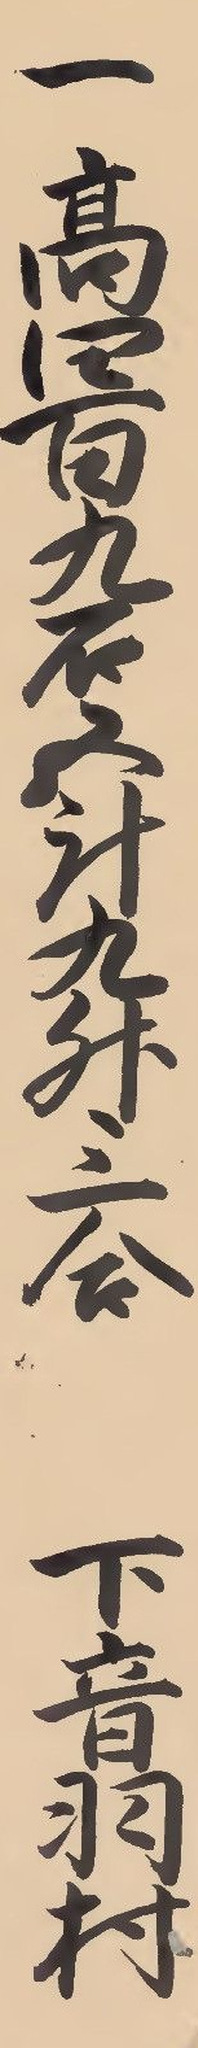一高四百九石五斗九升三合下音羽村
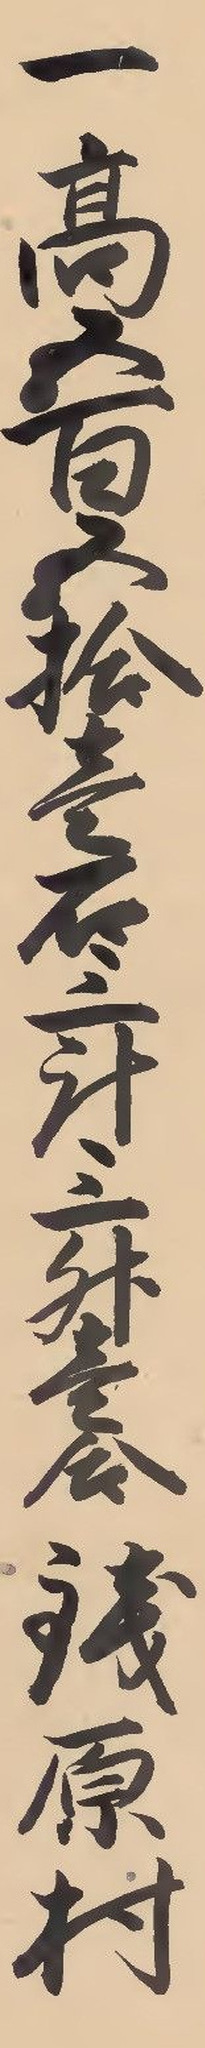一高五百五拾壱石三斗三升壱合銭原村

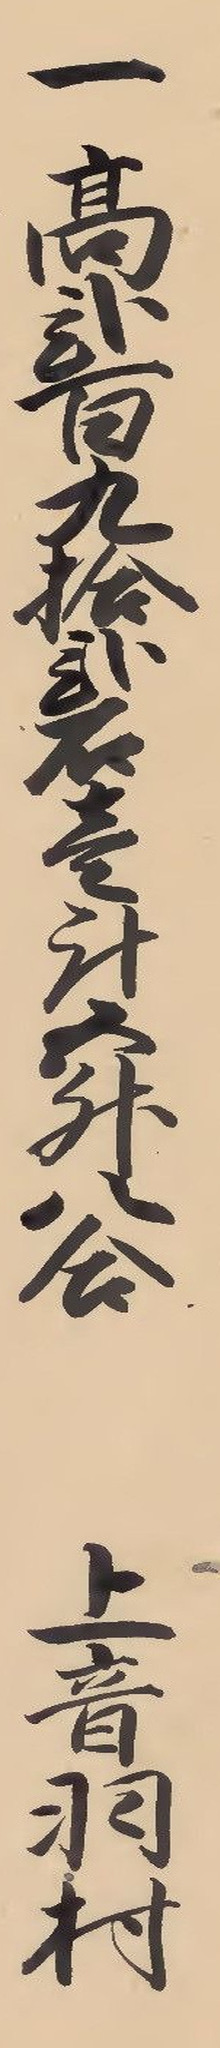一高弐百九拾弐石壱斗五升八合上音羽村
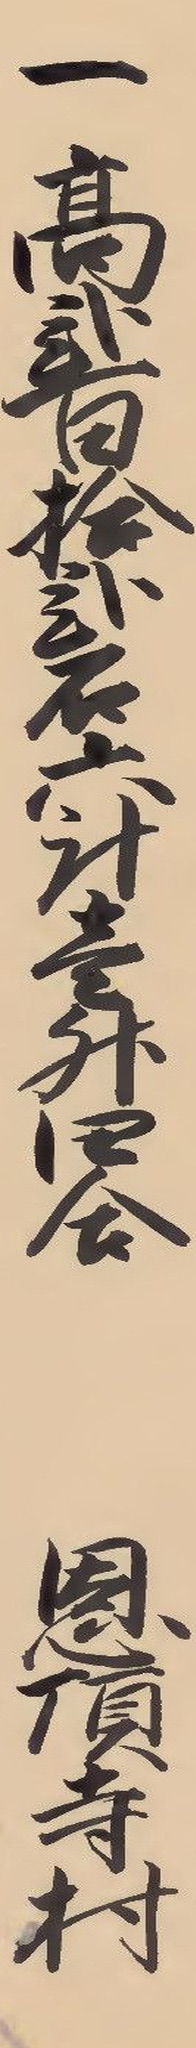一高弐百拾弐石六斗壱升四合恩頂寺村
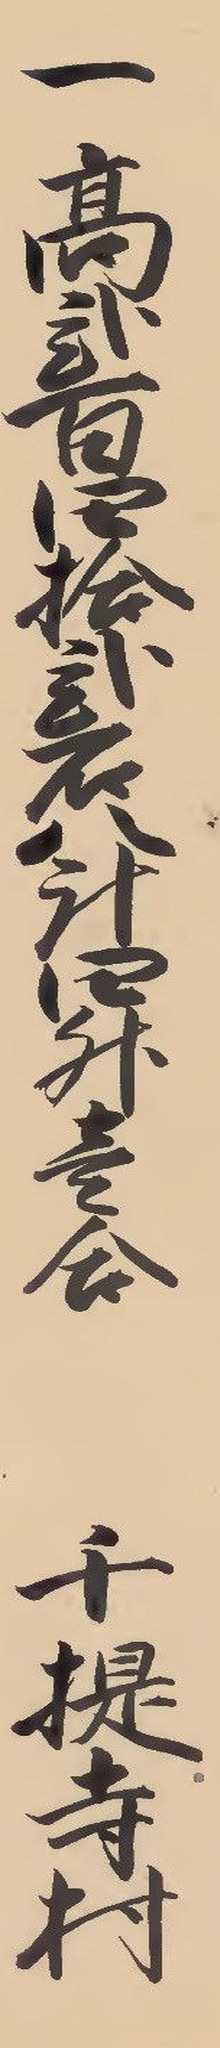一高弐百四拾弐石八斗四升壱合千提寺村
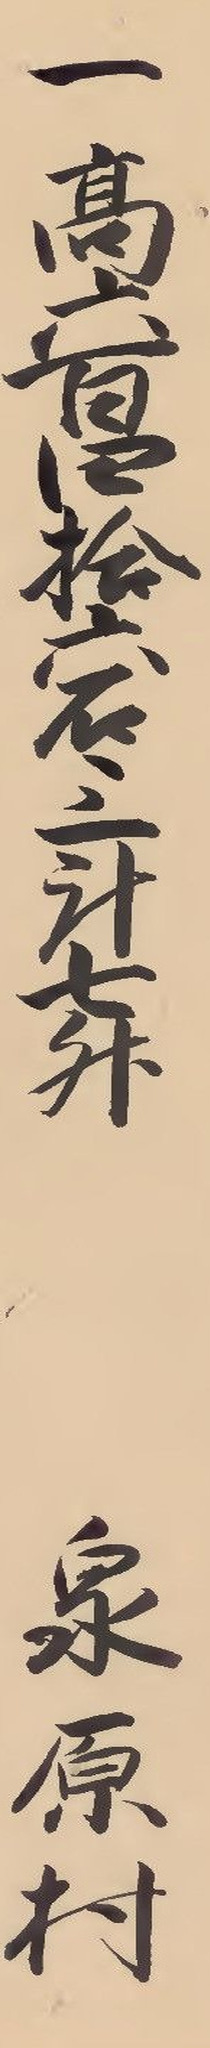一高六百四拾六石三斗七升泉原村
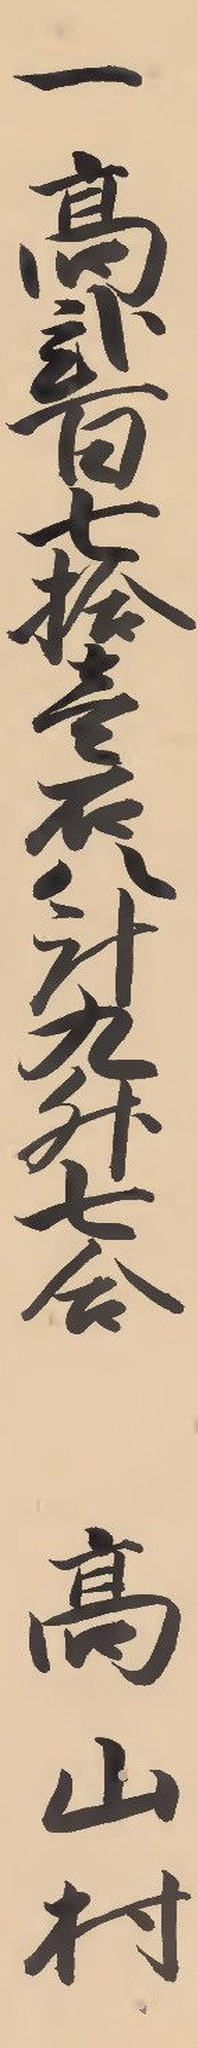一高弐百七拾壱石八斗九升七合高山村
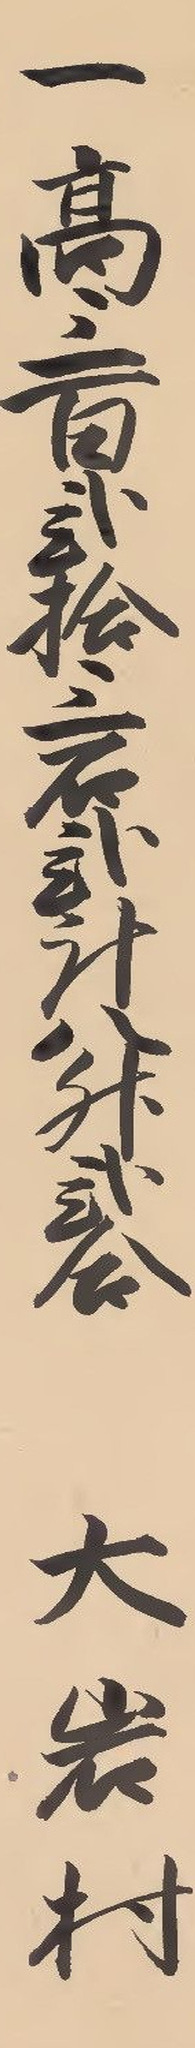一高三百弐拾三石弐斗八升弐合大岩村
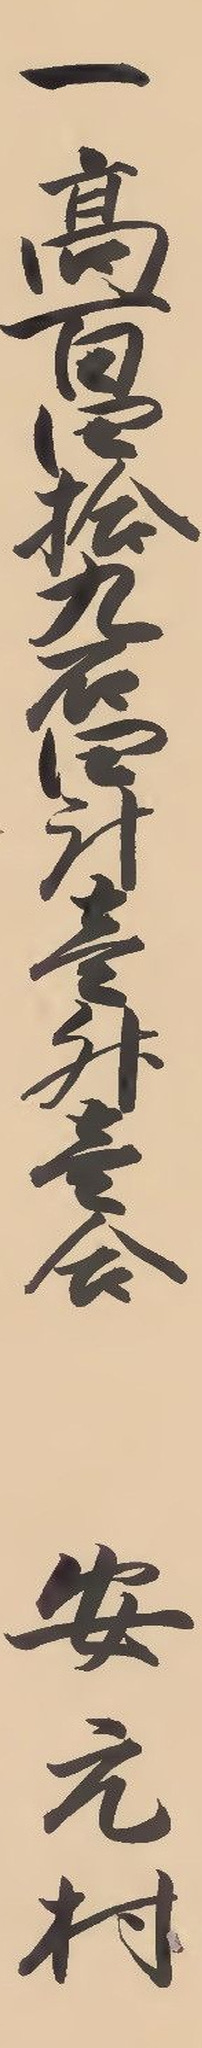一高百四拾九石四斗壱升壱合安元村
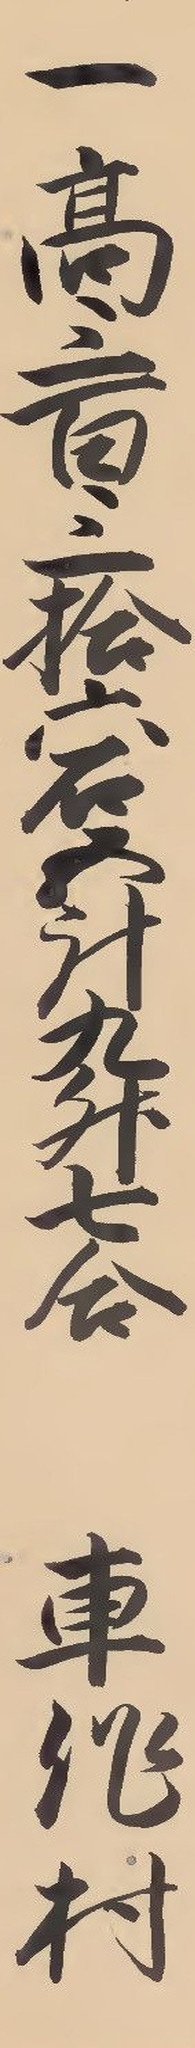一高三百三拾六石五斗九升七合車作村

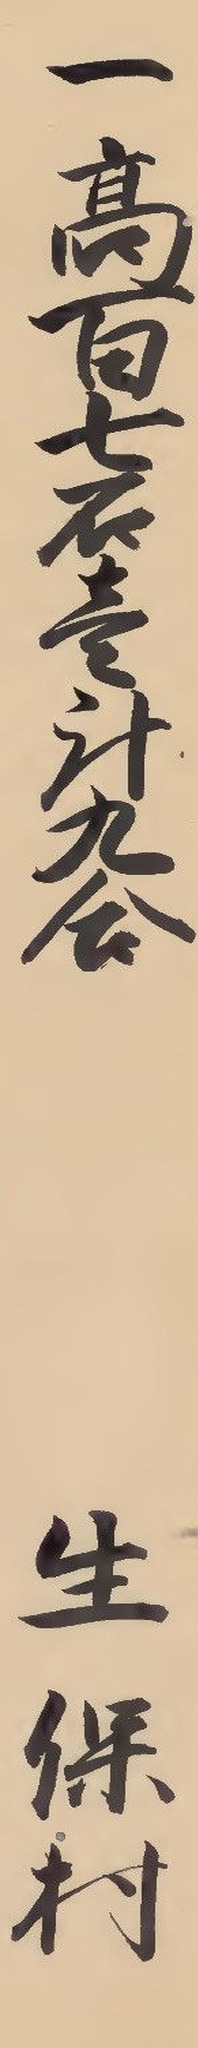一高百七石壱斗九合生保村
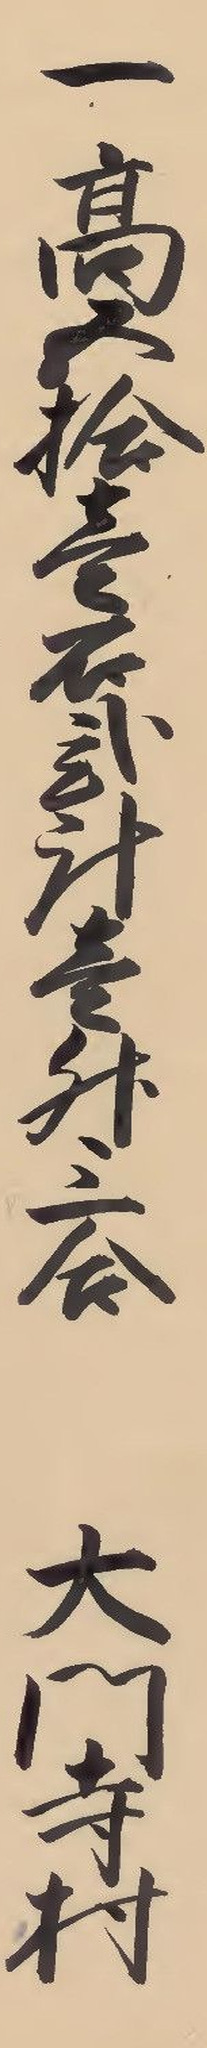一高五拾壱石弐斗壱升三合大門寺村
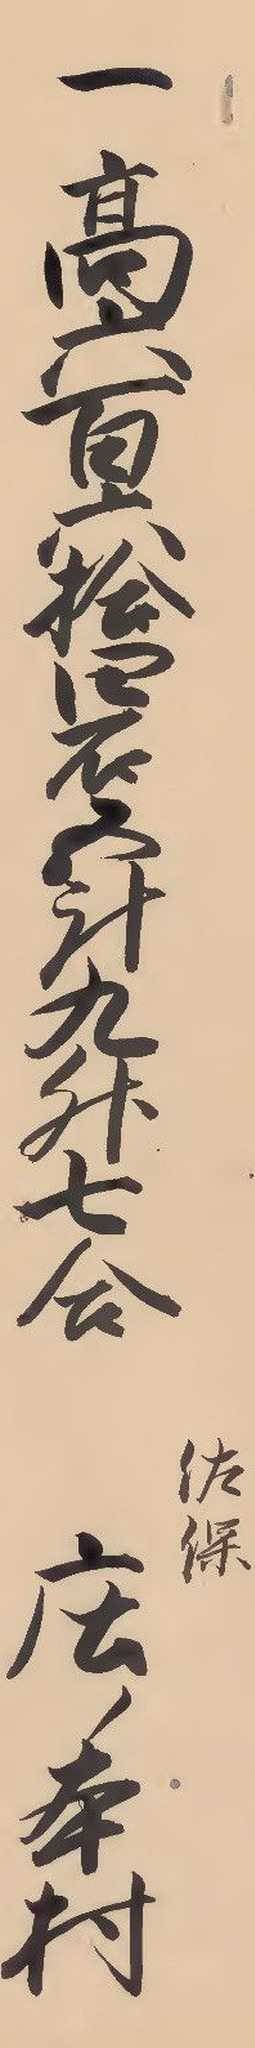一高六百六拾四石五斗九升七合庄ノ本村
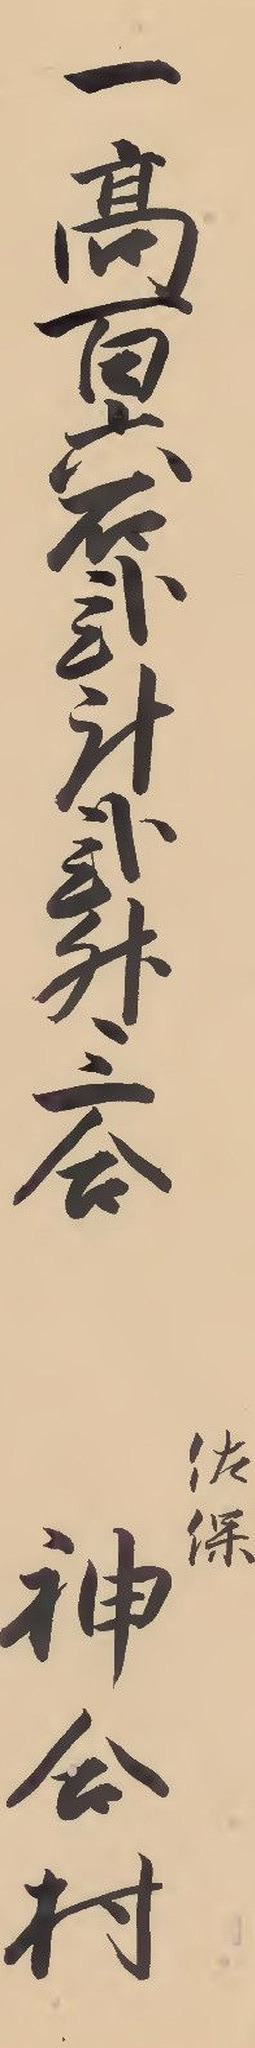一高百六石弐斗弐升三合神合村
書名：摂津国郷帳
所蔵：国立公文書館 National Archives of Japan
